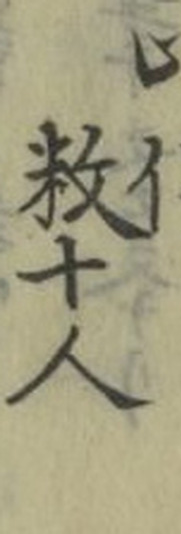数十人
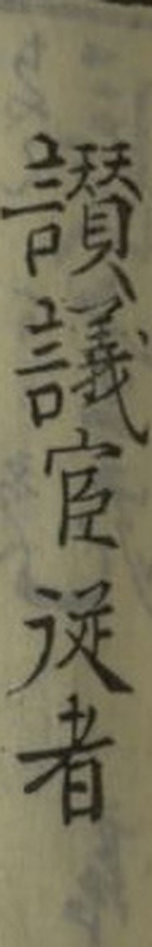讃議宦従者
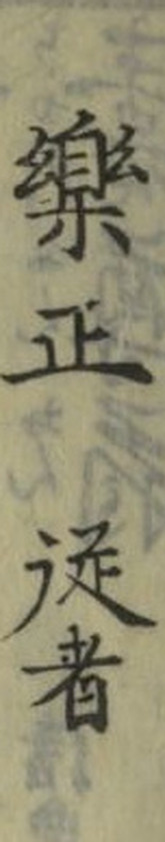楽正従者
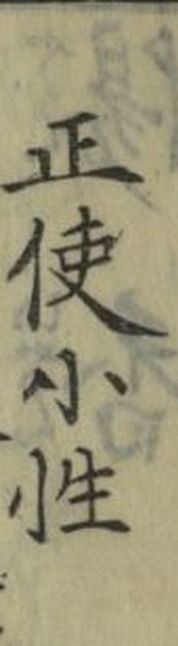正使小性
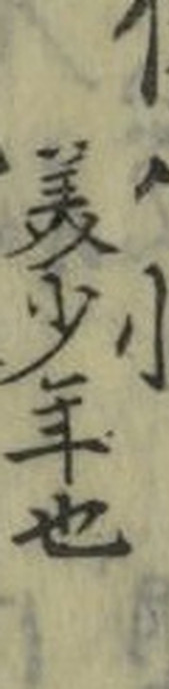美少年也
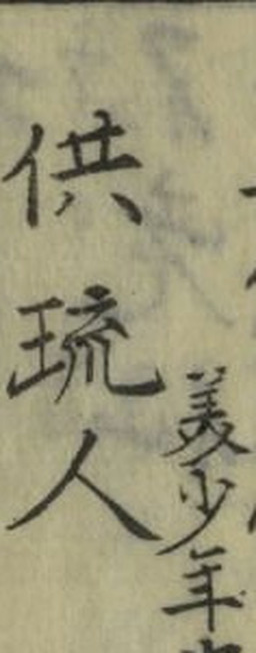供琉人
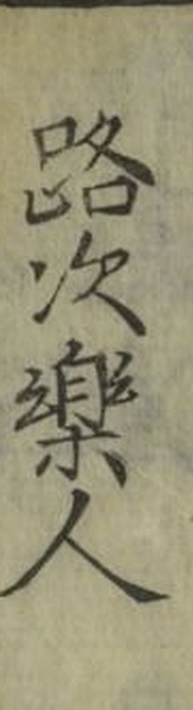路次楽人
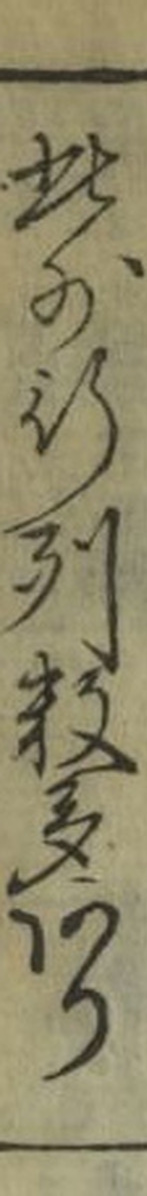此外行列数多あり
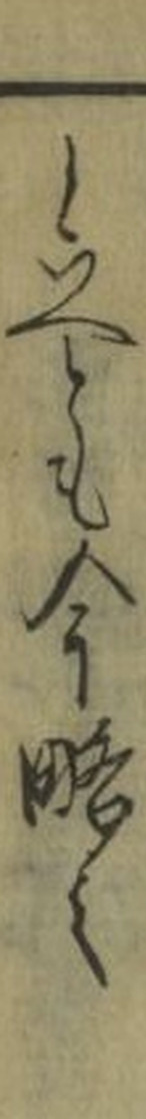といへとも今略之

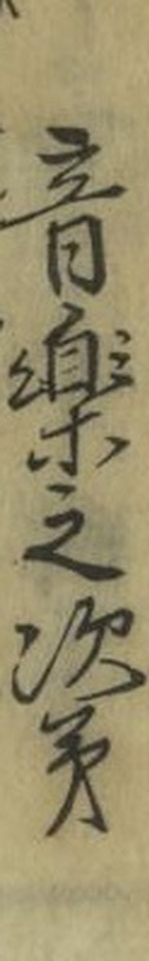音楽之次第
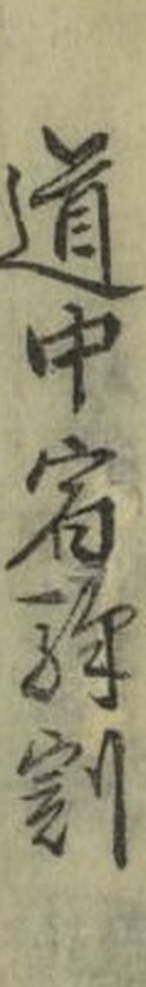道中宿駅割
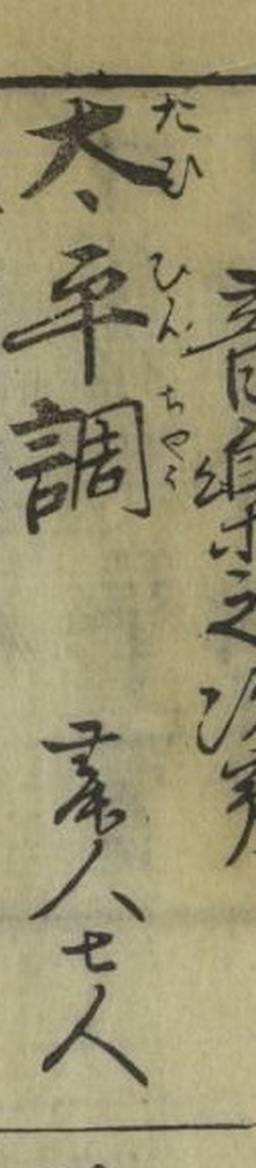太平調舞人七人
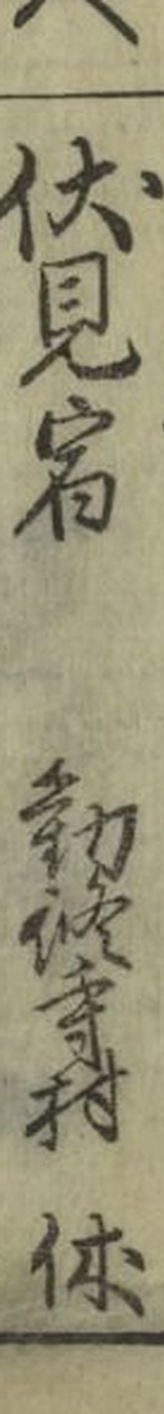伏見宿勧修寺村休
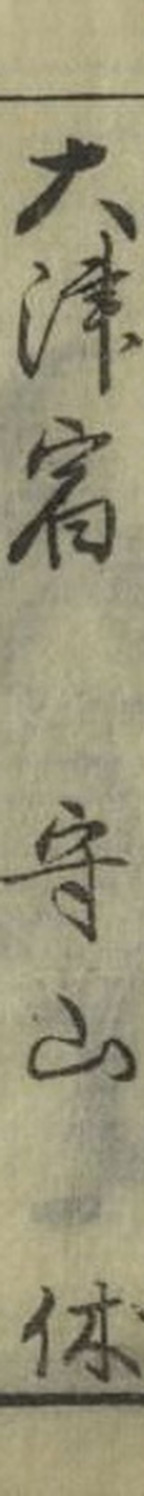大津宿守山休
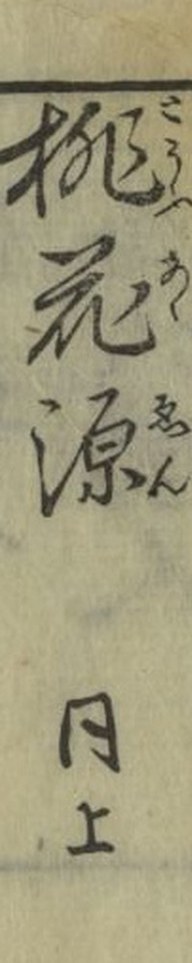桃花源同上
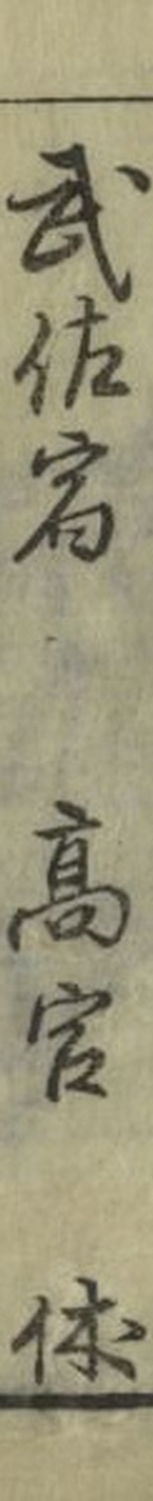武佐宿高宮休
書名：琉球人行列記
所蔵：University of the Ryukyus Library
